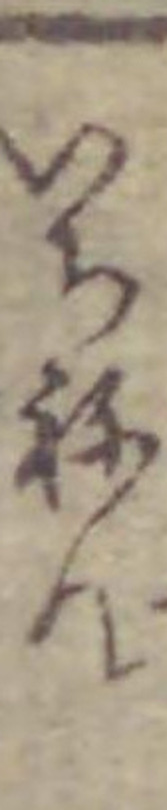いちねん
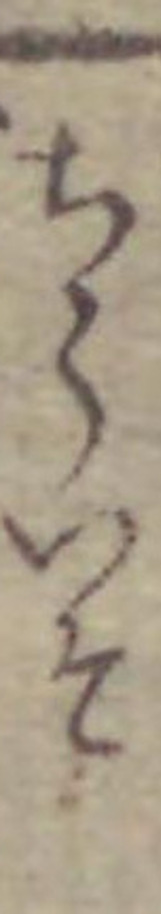ちういそ
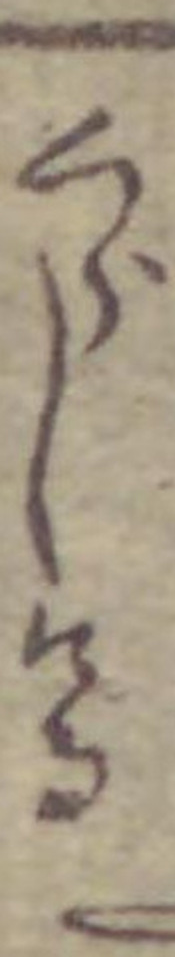くらしける
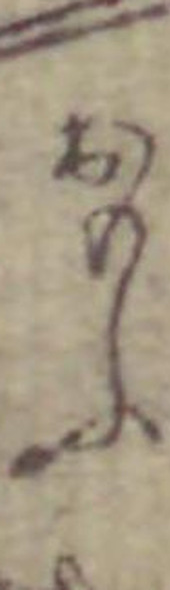おもふ
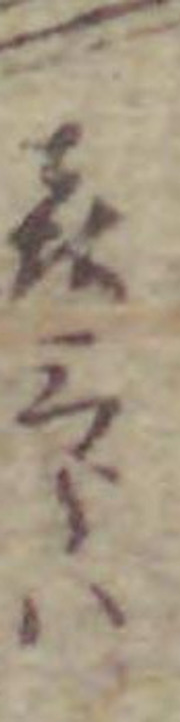喜三郎は
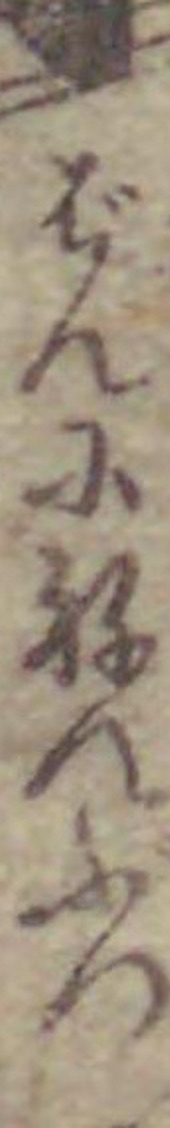ばんにねんぶつ
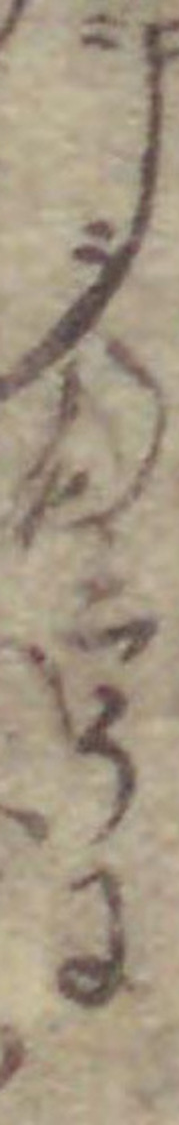こうに

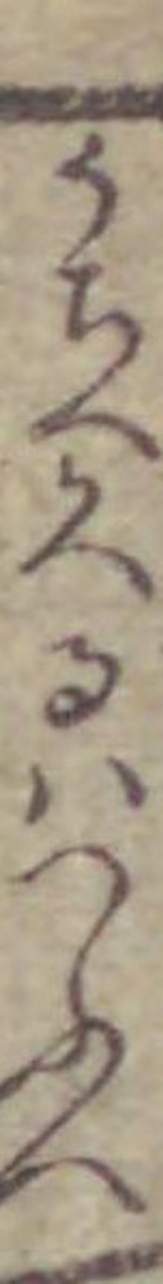うちへかへるはつふへ
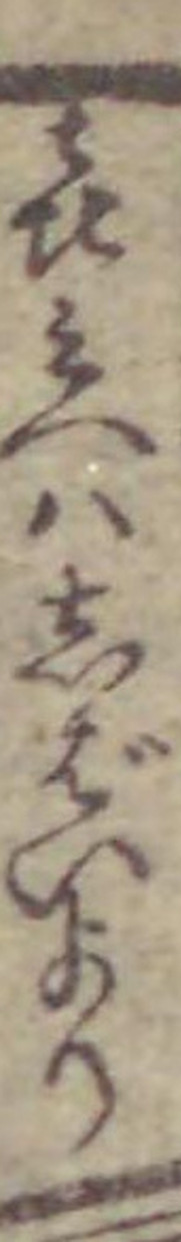喜兵へはしばいより
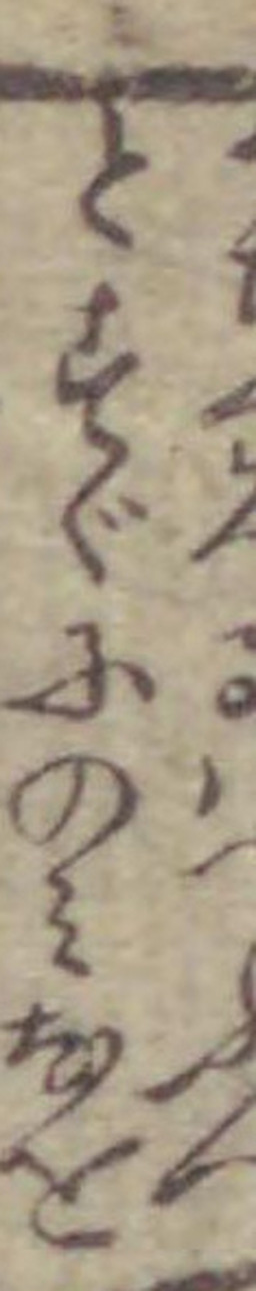とすぐにのみなを
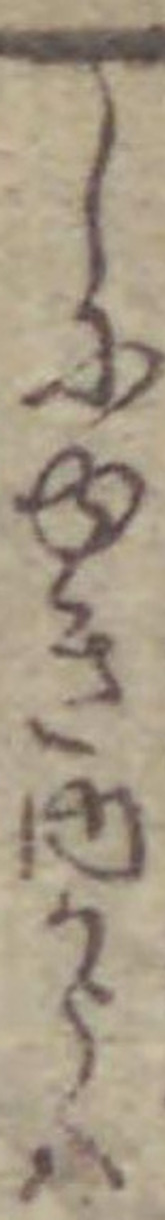しにゆき内からは
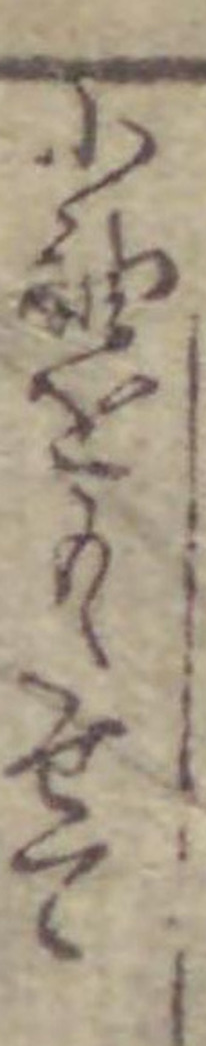小袖をもたせて
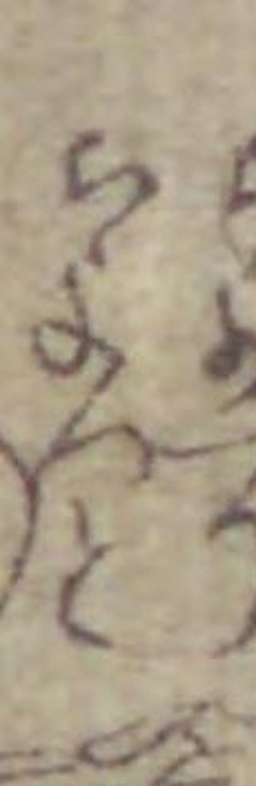ちよつと
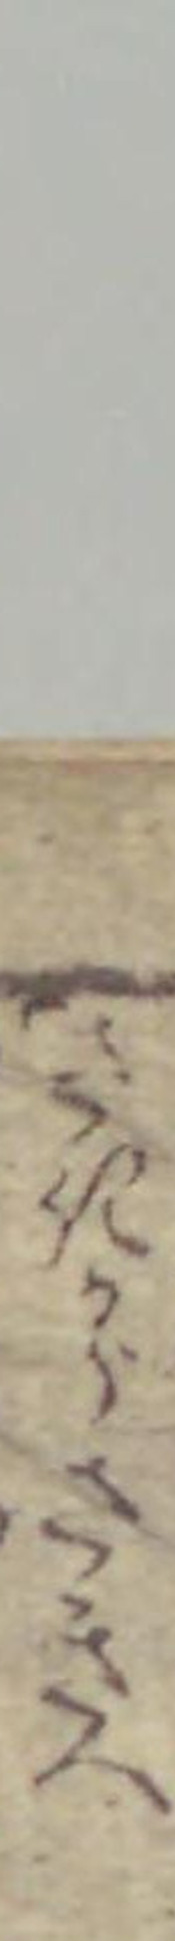さきからさきへ
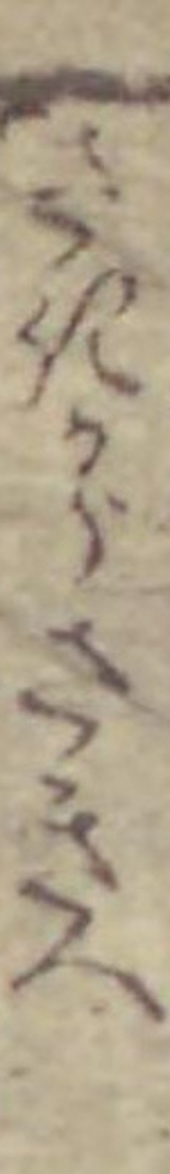さきからさきへ
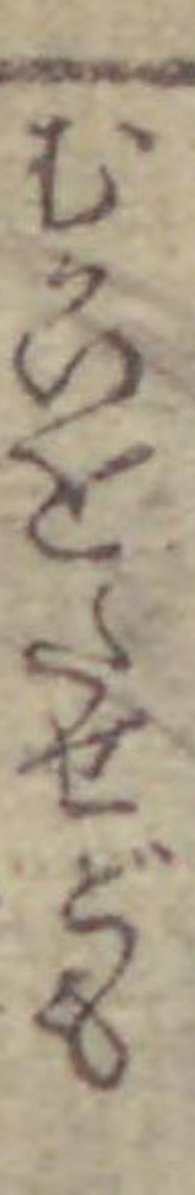むかいをたせども
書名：親父布子鳶握 3巻
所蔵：国立国会図書館 National Diet Library, JAPAN
